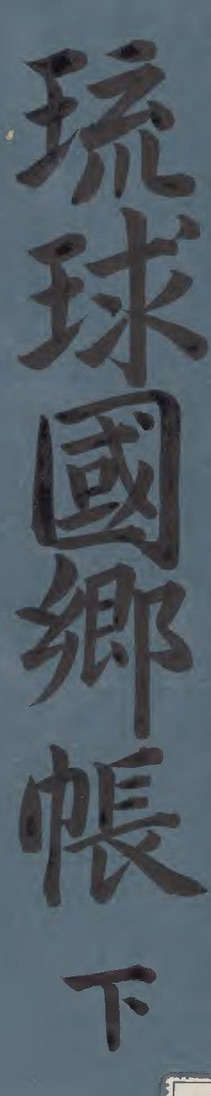琉球国郷帳下

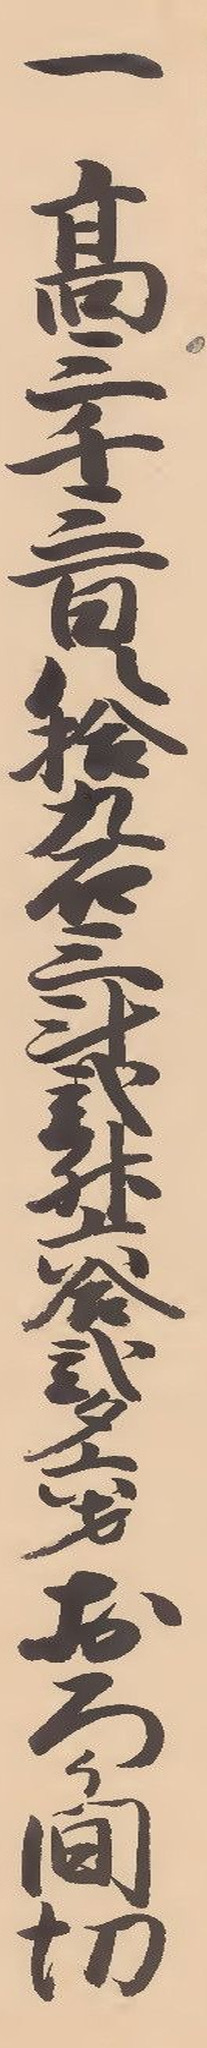一高三千三百八拾九石三斗弐升六合弐勺六才おろか間切
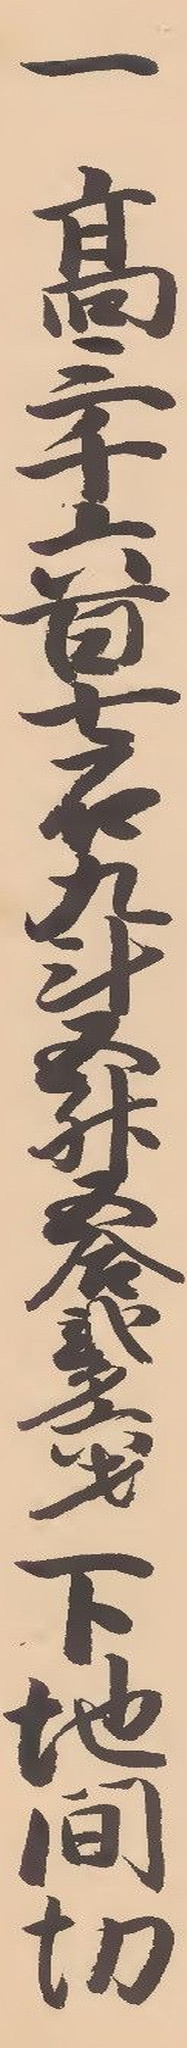一高三千六百七石九斗五升五合弐勺六才下地間切

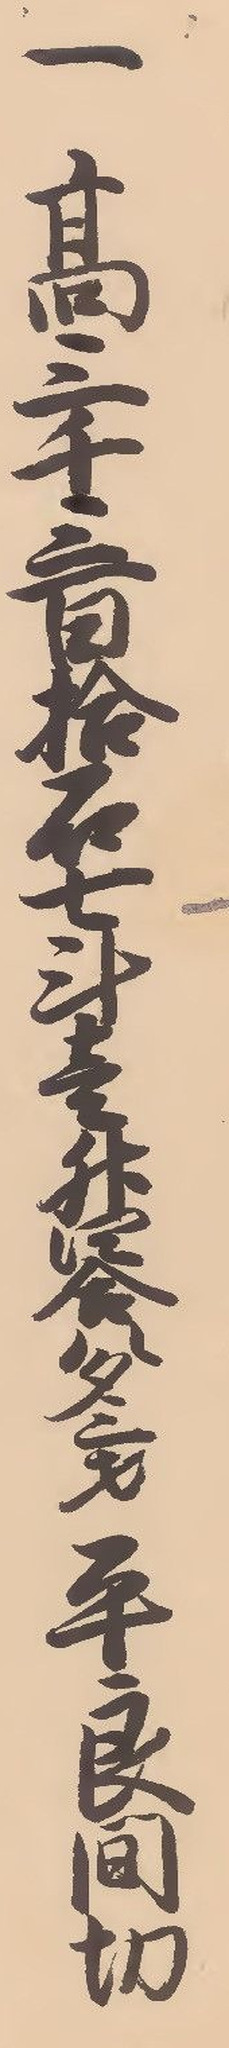一高三千三百拾石七斗壱升四合八勺三才平良間切
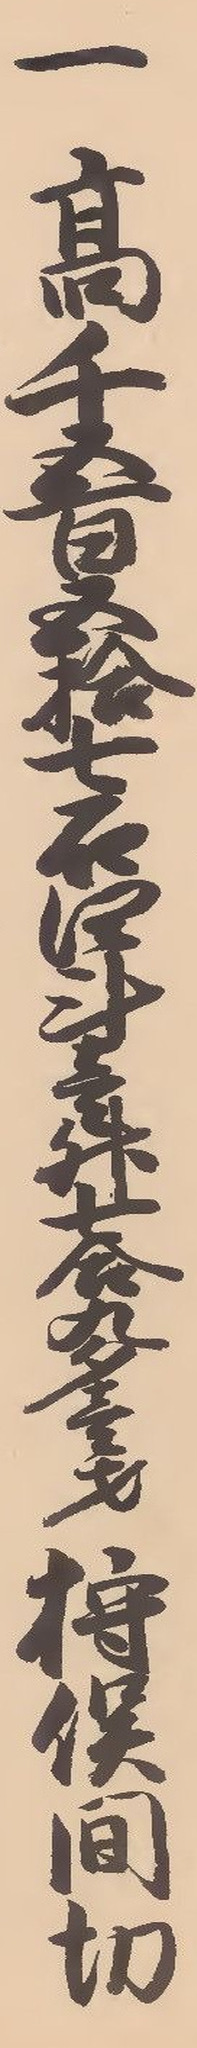一高千五百五拾七石四斗壱升七合九勺壱才狩俣間切
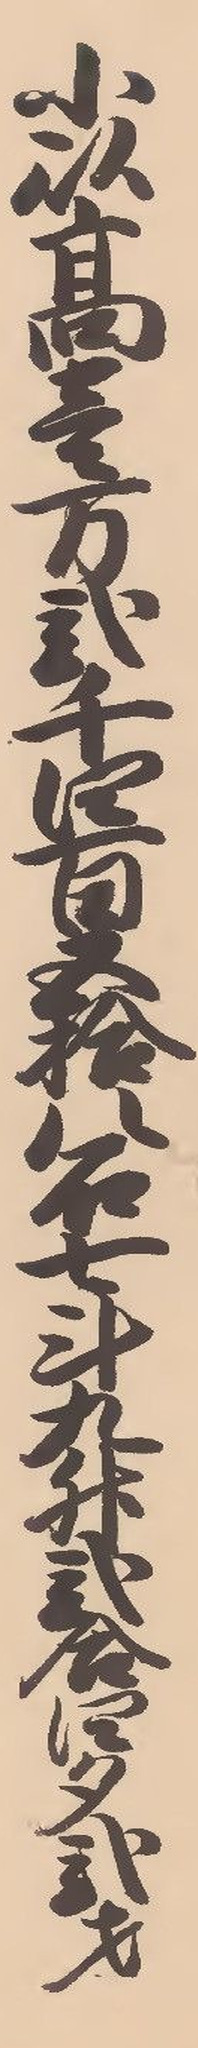小以高壱万弐千四百五拾八石七斗九升弐合四勺弐才

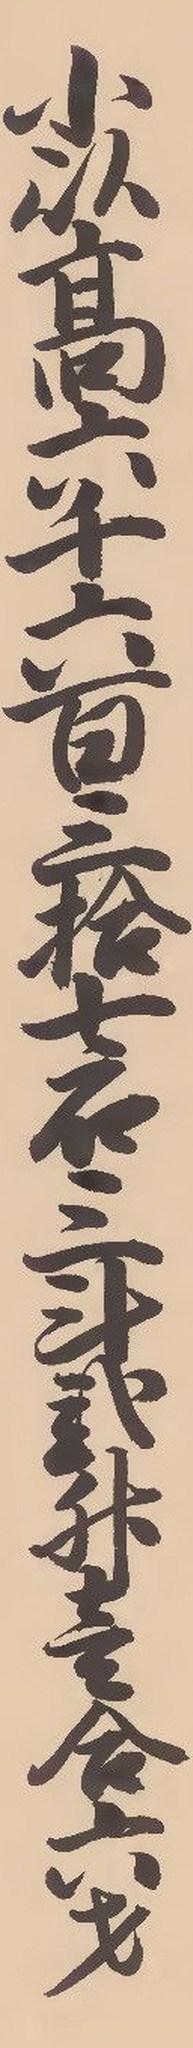小以高六千六百三拾七石三斗弐升壱合六才
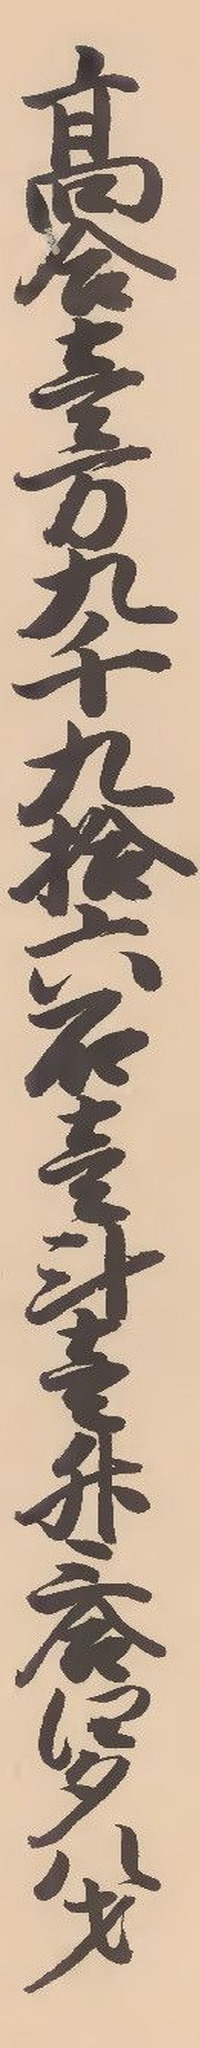高合壱万九千九拾六石壱斗壱升三合四勺八才
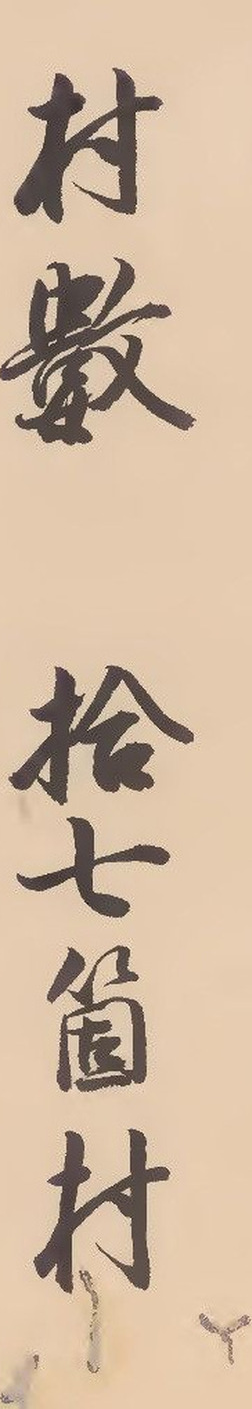村数拾七箇村
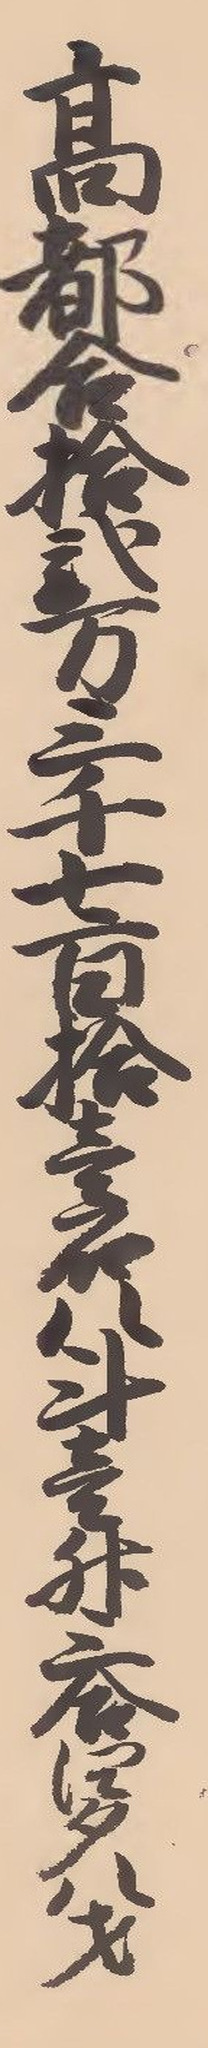高都合拾弐万三千七百拾壱石八斗壱升三合四勺八才
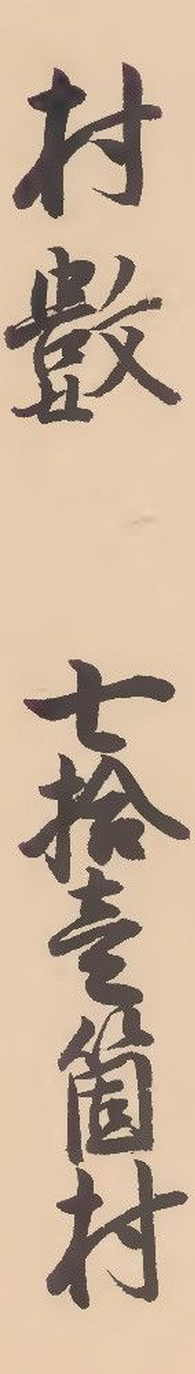村数七拾壱箇村

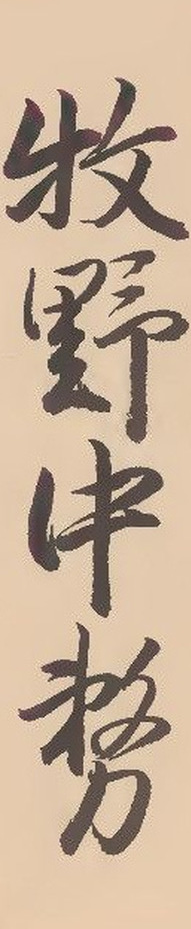牧野中務
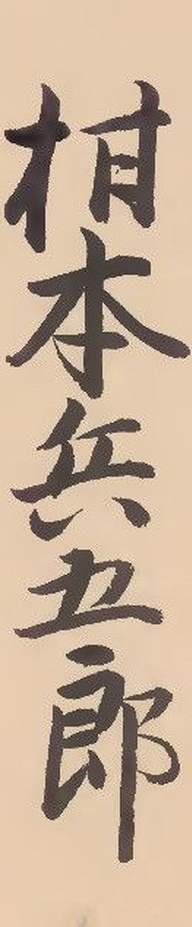柑本兵五郎
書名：琉球国郷帳　下
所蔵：国立公文書館 National Archives of Japan
